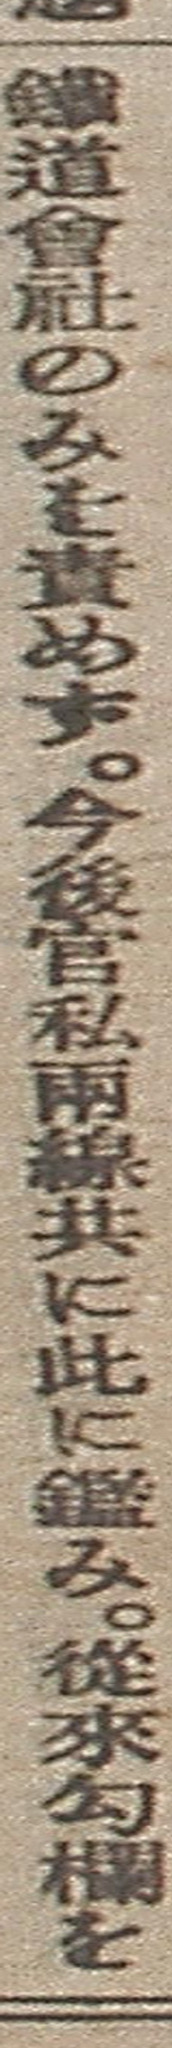鉄道会社のみを責めず。今後官私両線共に此に鑑み。従来勾欄を
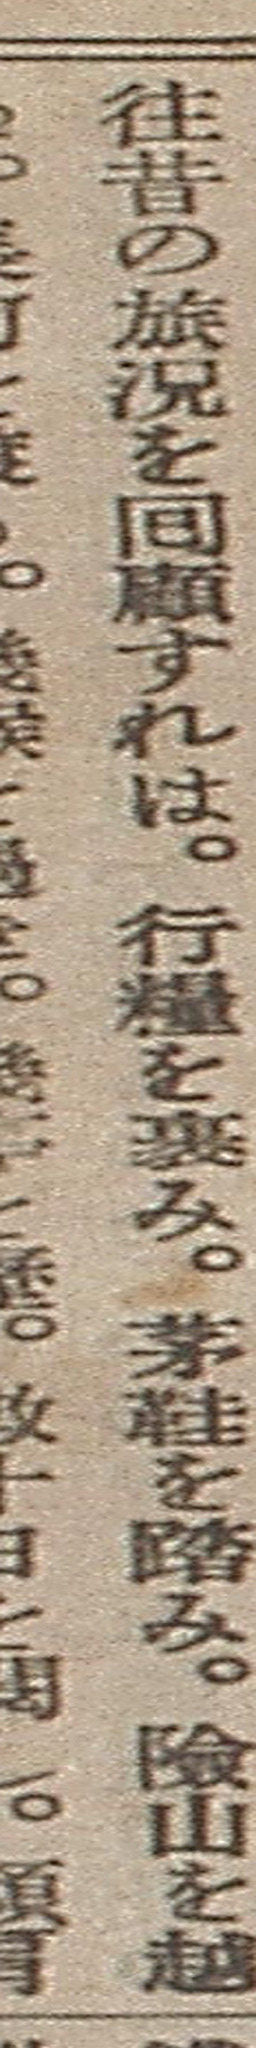え。長河を渡り。幾堠を過き。幾亭を歴。数十日を閲し。頳肩
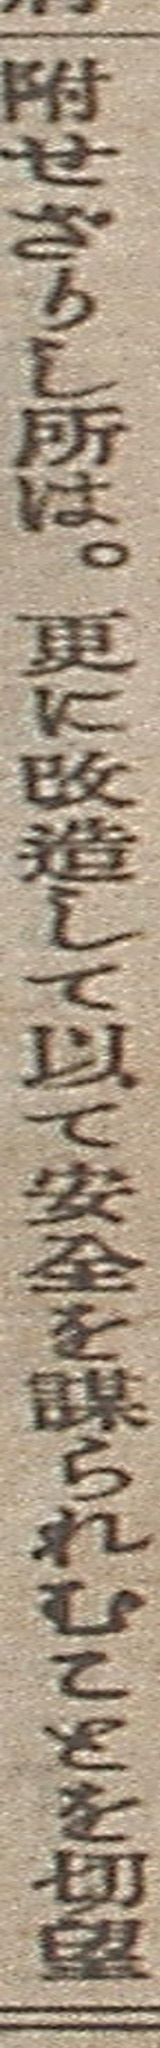附せざりし所は。更に改造して以て安全を謀られむことを切望
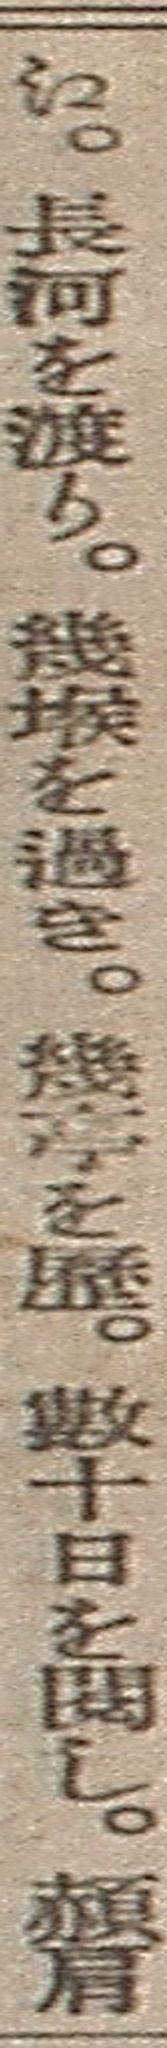え。長河を渡り。幾堠を過き。幾亭を歴。数十日を閲し。頳肩
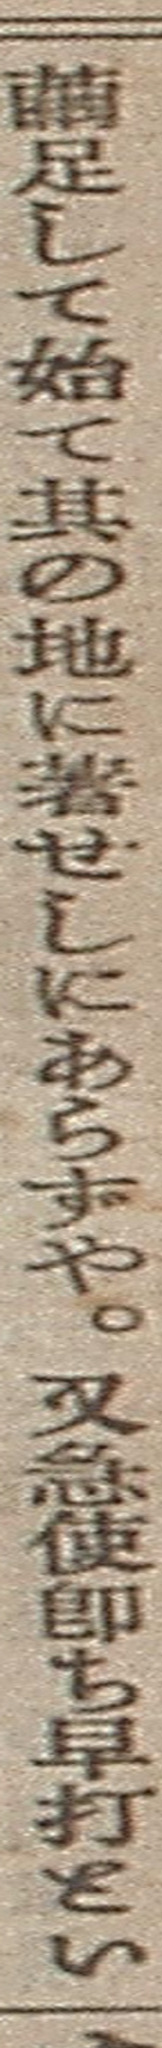繭足して始て其の地に著せしにあらずや。又急使即ち早打とい
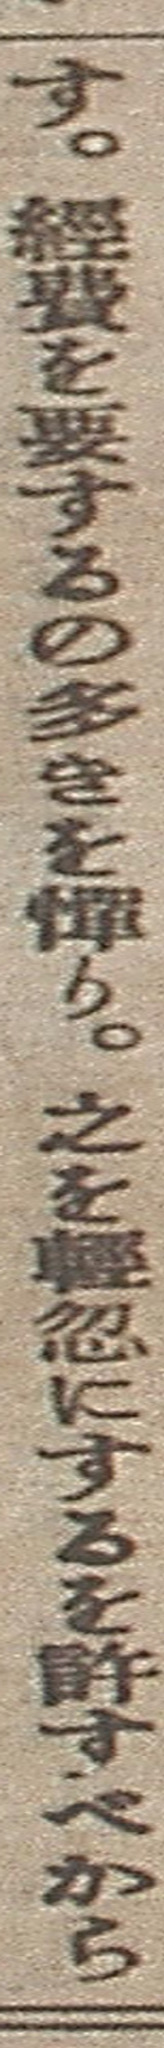す。経費を要するの多きを憚り。之を軽忽にするを許すべから
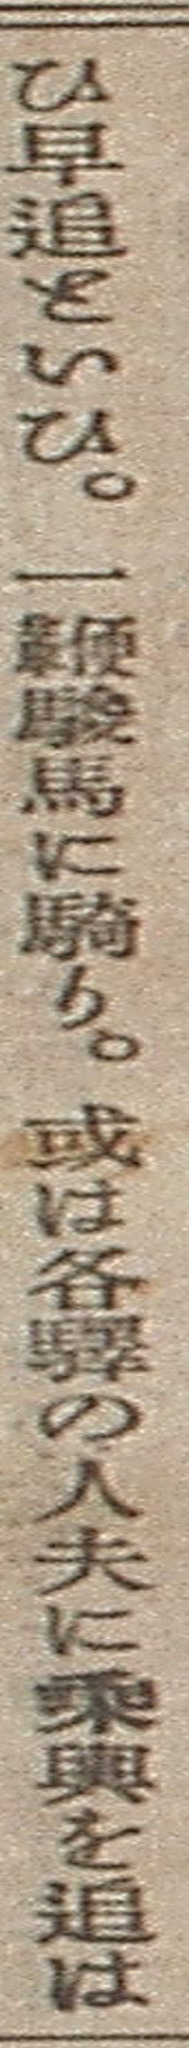ひ早追といひ。一鞭駿馬に騎り。或は各駅の人夫に乗輿を追は
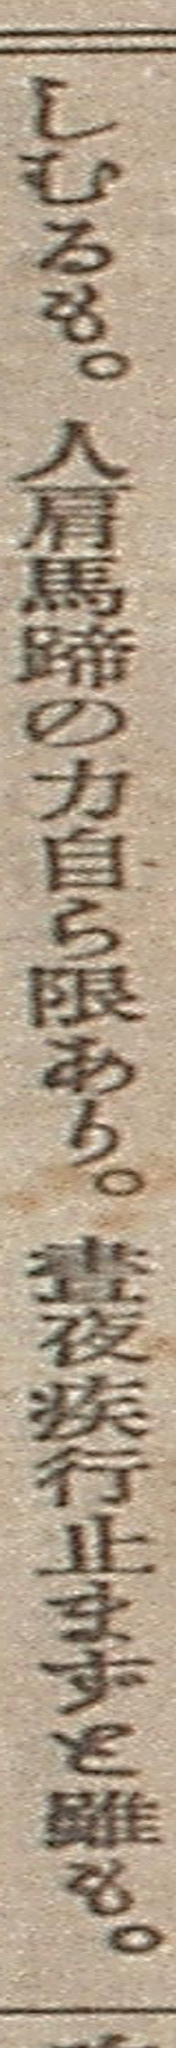しむるも。人肩馬蹄の力自ら限あり。昼夜疾行止まずと雖も。
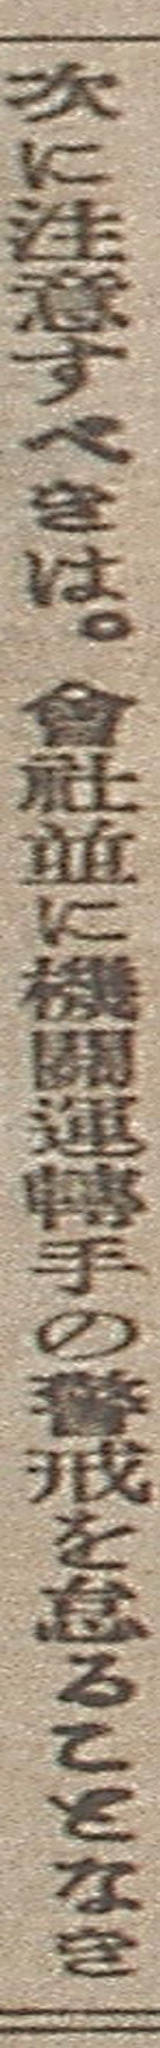次に注意すべきは。会社並に機関運転手の警戒を怠ることなき
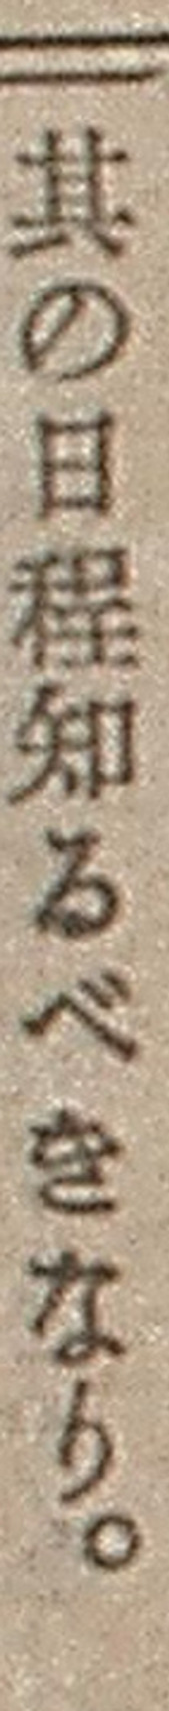其の日程知るべきなり。
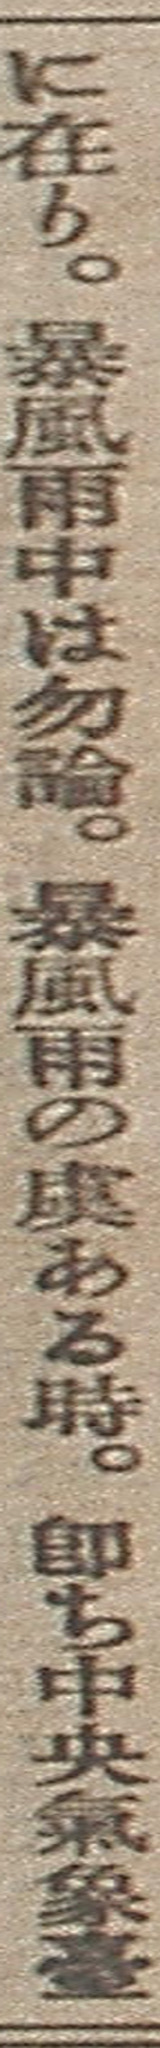に在り。暴風雨中は勿論。暴風雨の虞ある時。即ち中央気象台
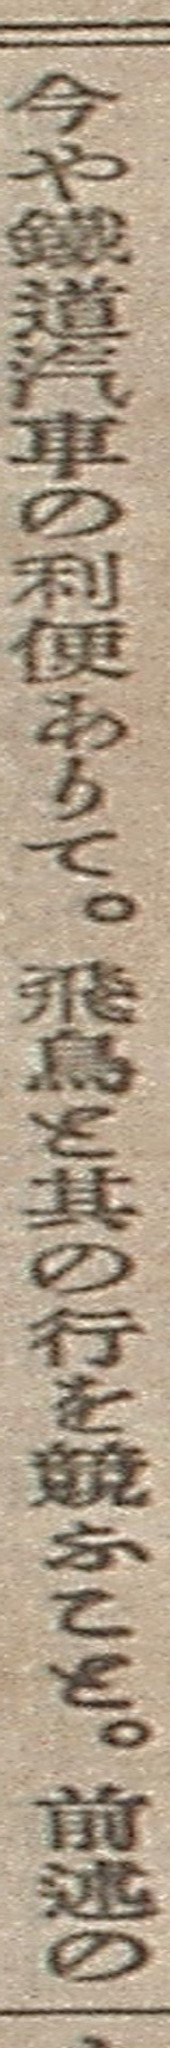今や鉄道汽車の利便ありて。飛鳥と其の行を競ふこと。前述の
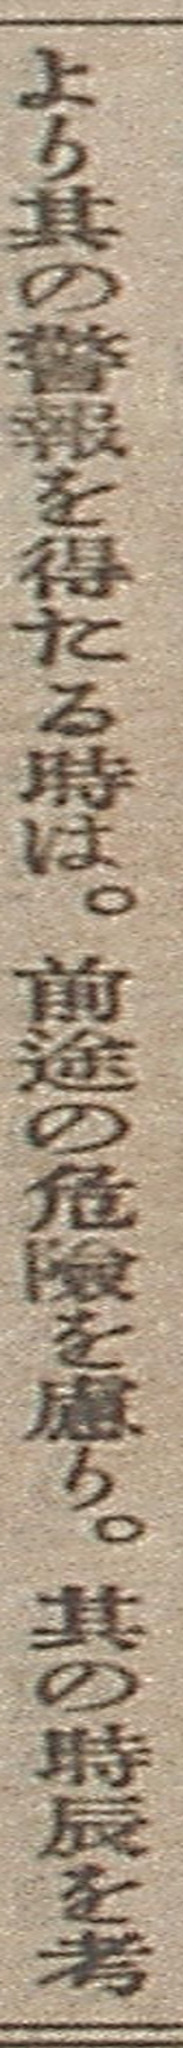より其の警報を得たる時は。前途の危険を慮り。其の時辰を考
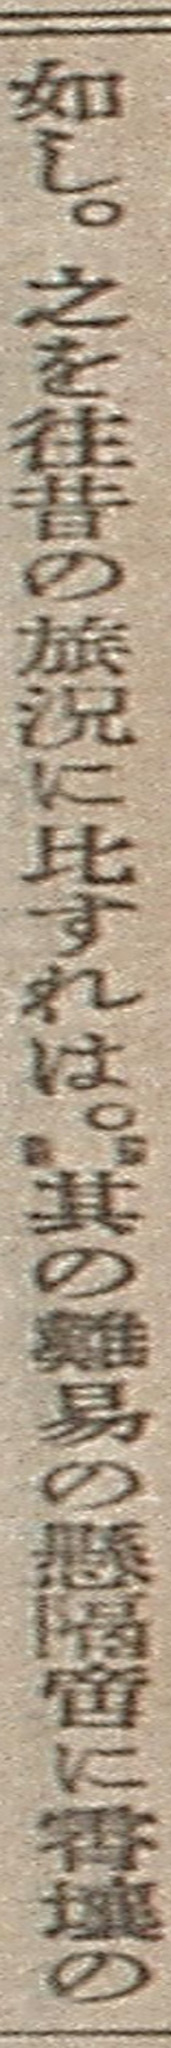如し。之を往昔の旅況に比すれは。其の難易の懸隔啻に霄壌の
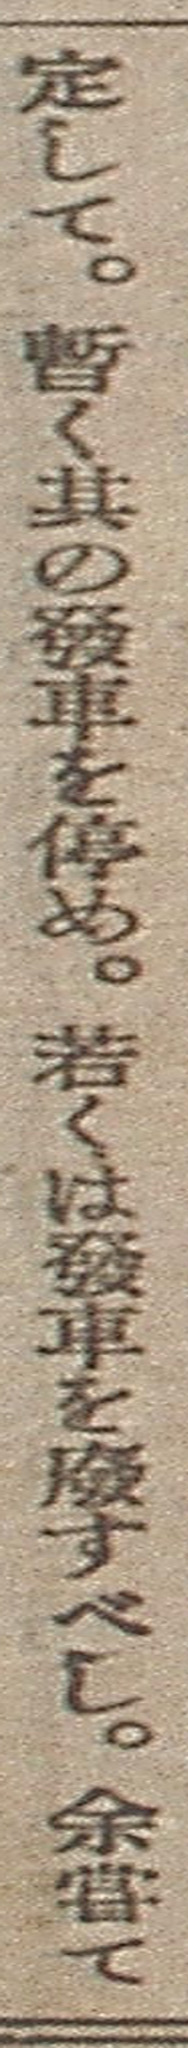定して。暫く其の発車を停め。若くは発車を廃すべし。余嘗て

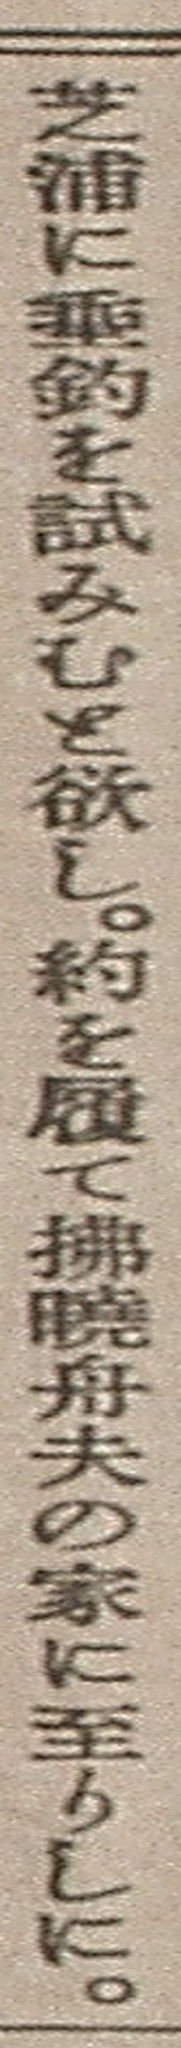芝浦に垂釣を試みむと欲し。約を履て払曉舟夫の家に至りしに。
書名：風俗畫報臨時増刊第百九十九號　明治三十二年十月各地災害圖會（前編之續）
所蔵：東京大学地震研究所図書室 Earthquake Research Institute Library, The University of Tokyo, JAPAN
